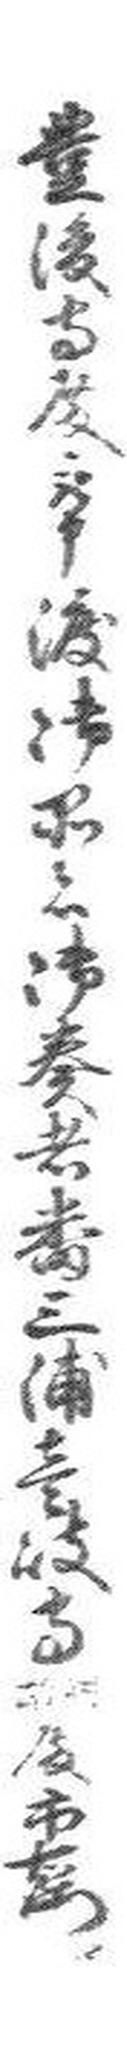豊後守殿被申渡御品者御奏者番三浦壱岐守明敬殿市右衛門江
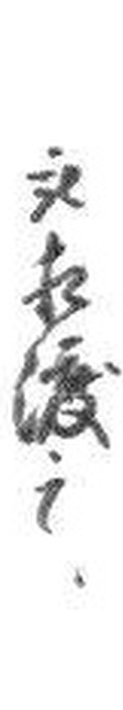被相渡之
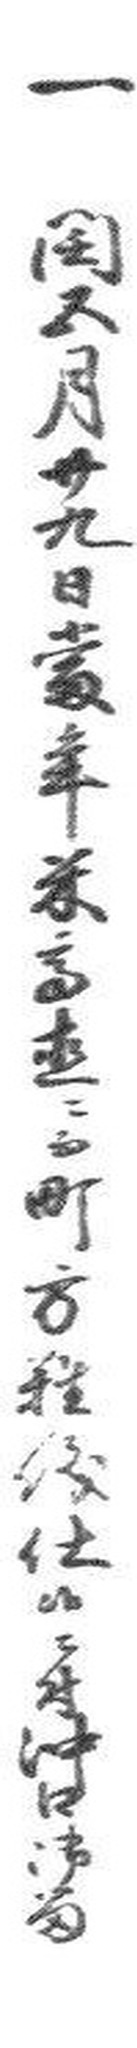一閏五月廿九日当年米高直ニ而町方難義仕候ニ付沖口御留
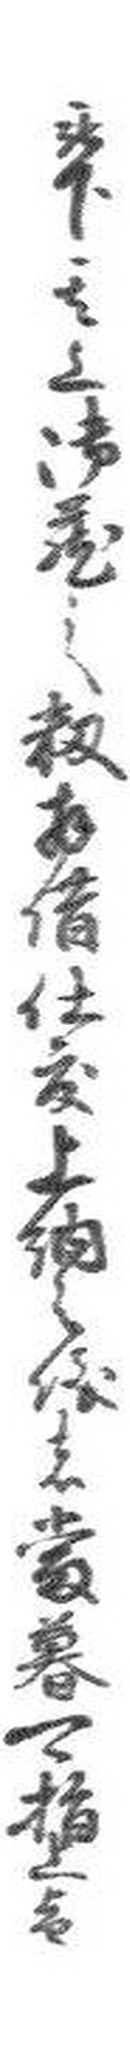被下其上御蔵之籾拝借仕度上納之儀者当暮可指上旨

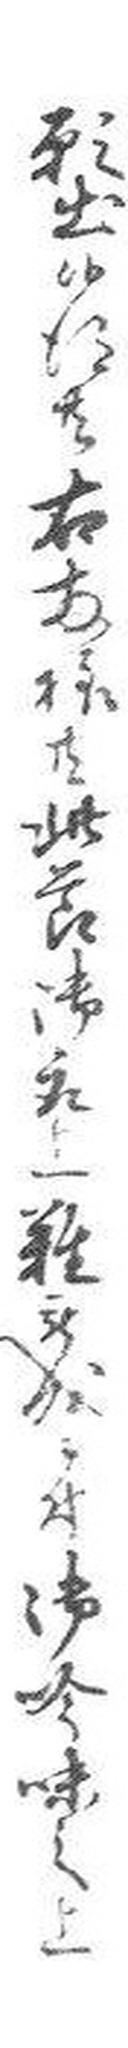願出候得共右両様共此節御取上難被成ニ付御吟味之上
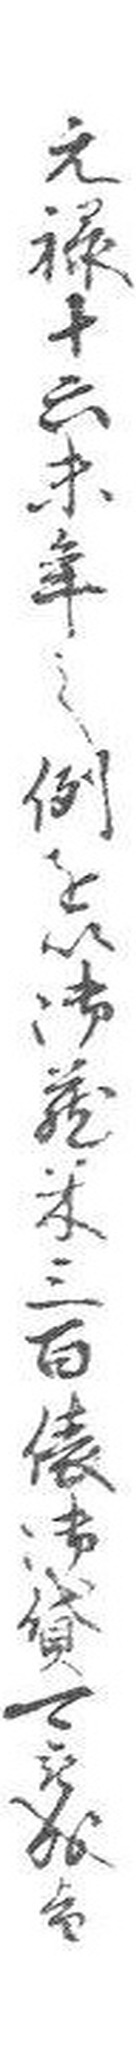元禄十六未年之例を以御蔵米三百俵御貸可被成旨
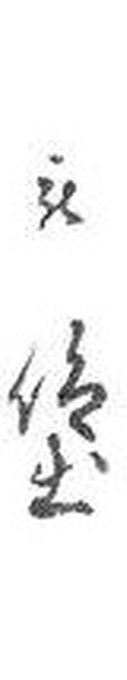被仰出
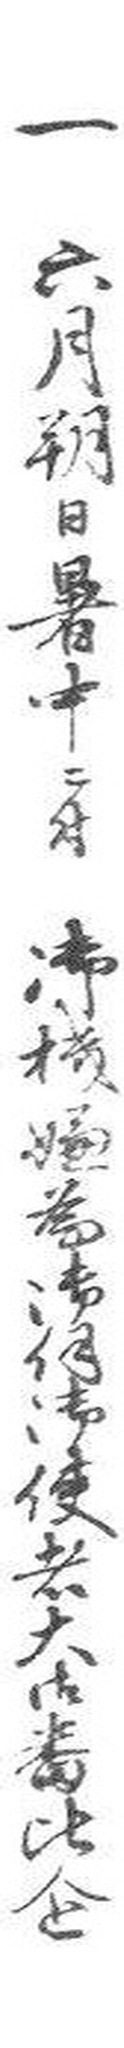一六月朔日暑中ニ付御機嫌為御伺御使者大御番比企
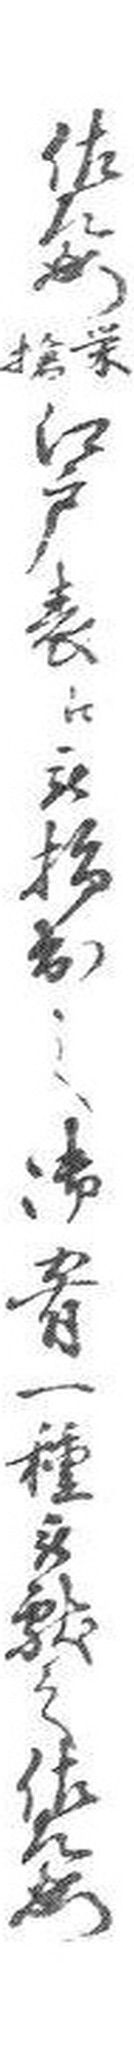佐左衛門業搶江戸表江被指出之御肴一種被献之佐左衛門
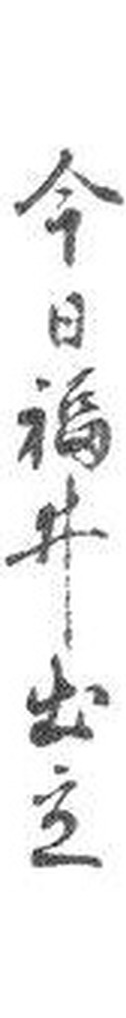今日福井出立
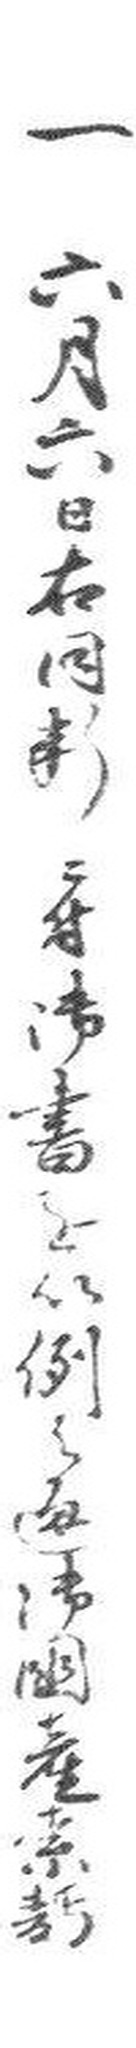一六月六日右同断ニ付御書を以例之通御国産索麵
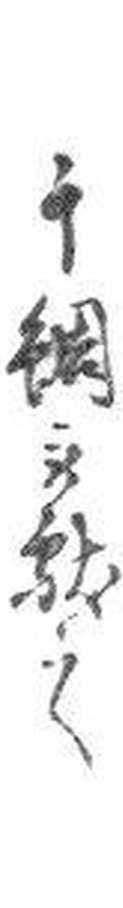干鯛被献之
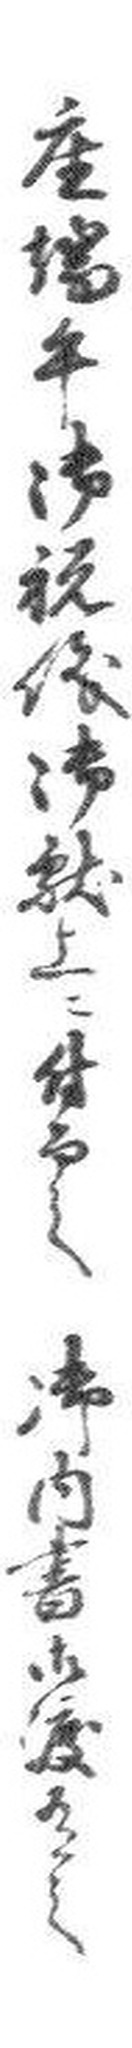座端午御祝儀御献上ニ付而之御内書御渡有之
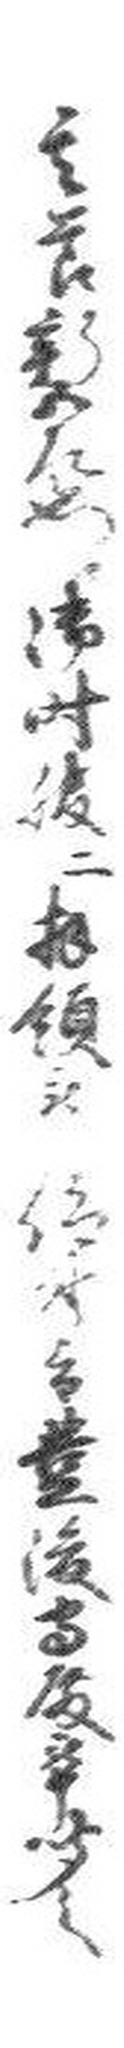其節新五左衛門御時服二拝領被仰付旨豊後殿被申聞之
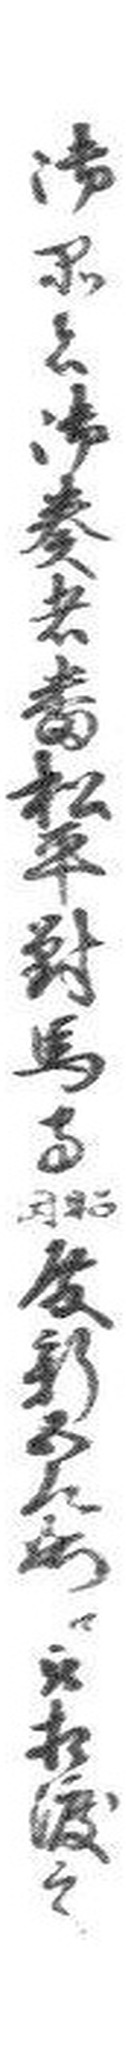御品者御奏者番松平対馬守殿新五左衛門江相渡之
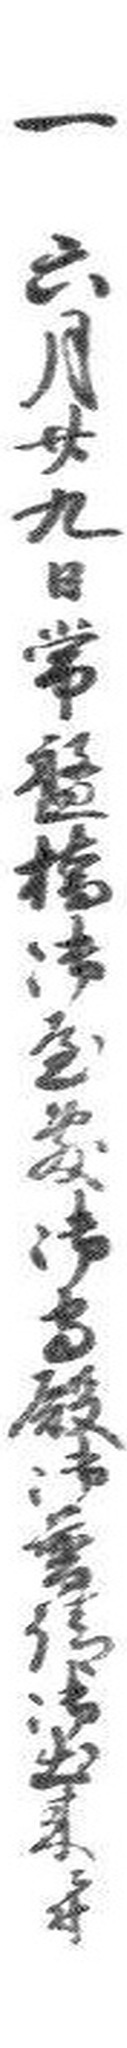一六月廿九日常盤橋御屋敷御守殿御普請御出来ニ付
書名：家譜 二十九 吉邦公 従正徳二年到正徳三年
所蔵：福井県文書館 Fukui Prefectural Archives
